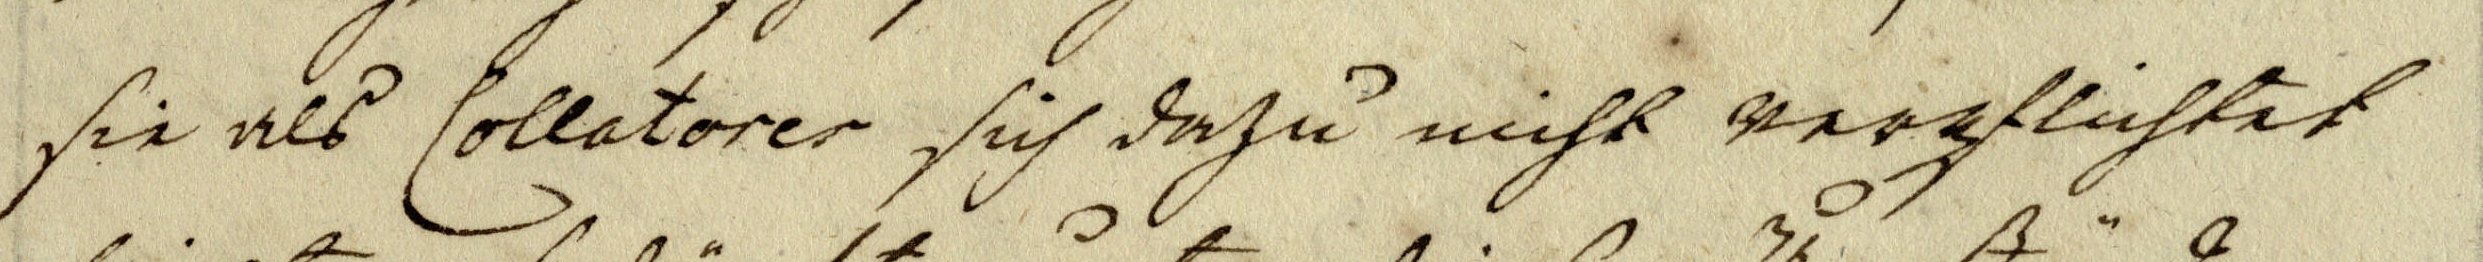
sie als Collatores sich dazu nicht verpflichtet
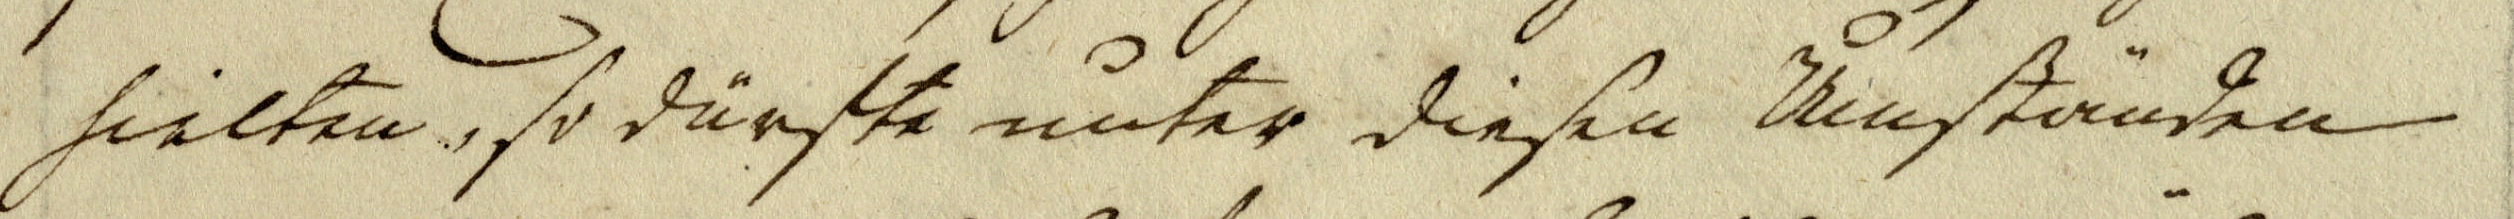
hielten, so dürfte unter diesen Umständen
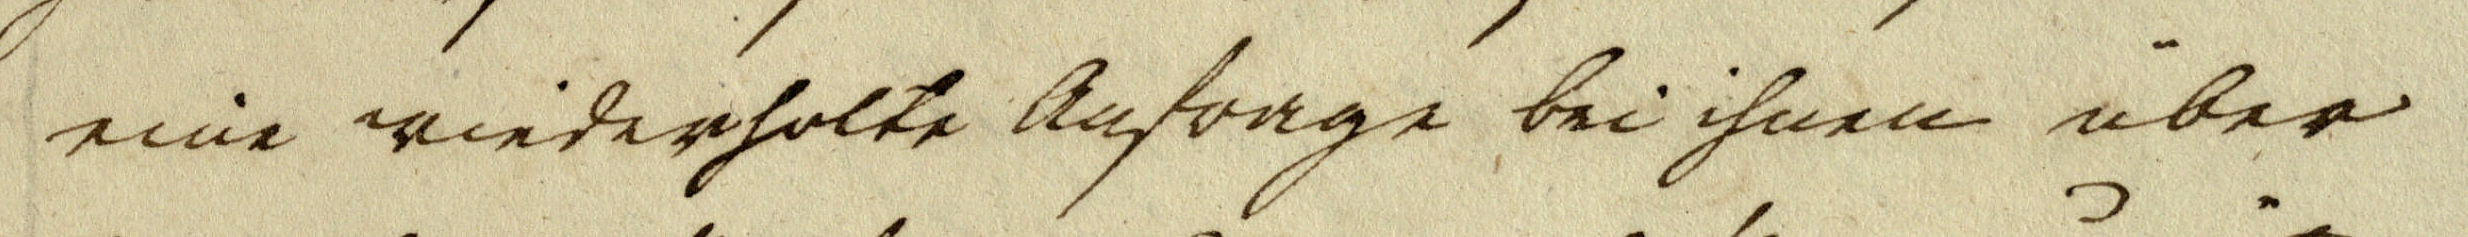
eine wiederholte Anfrage bei ihnen über
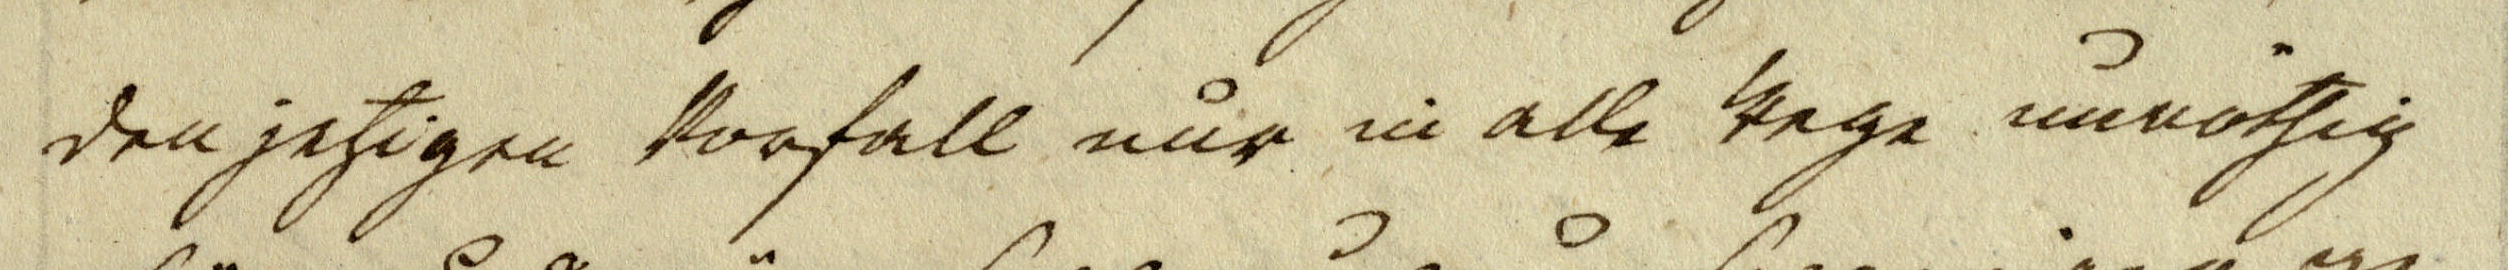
den jetzigen Vorfall nur in alle Wege unnöthig
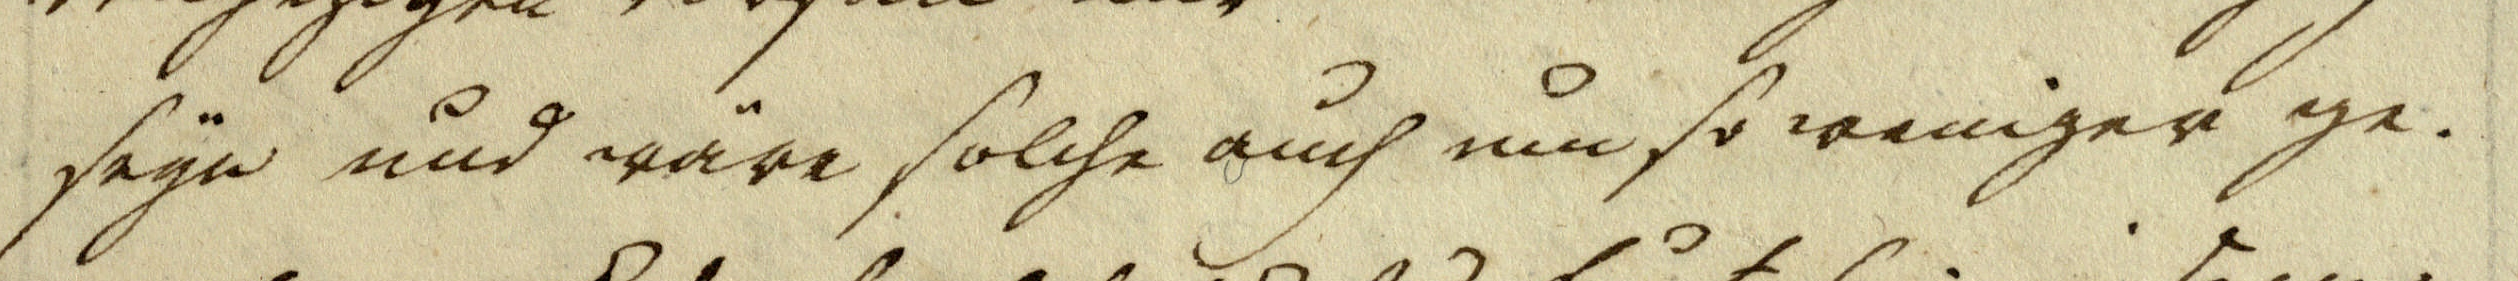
seÿn und wäre solche auch um so weniger ge¬
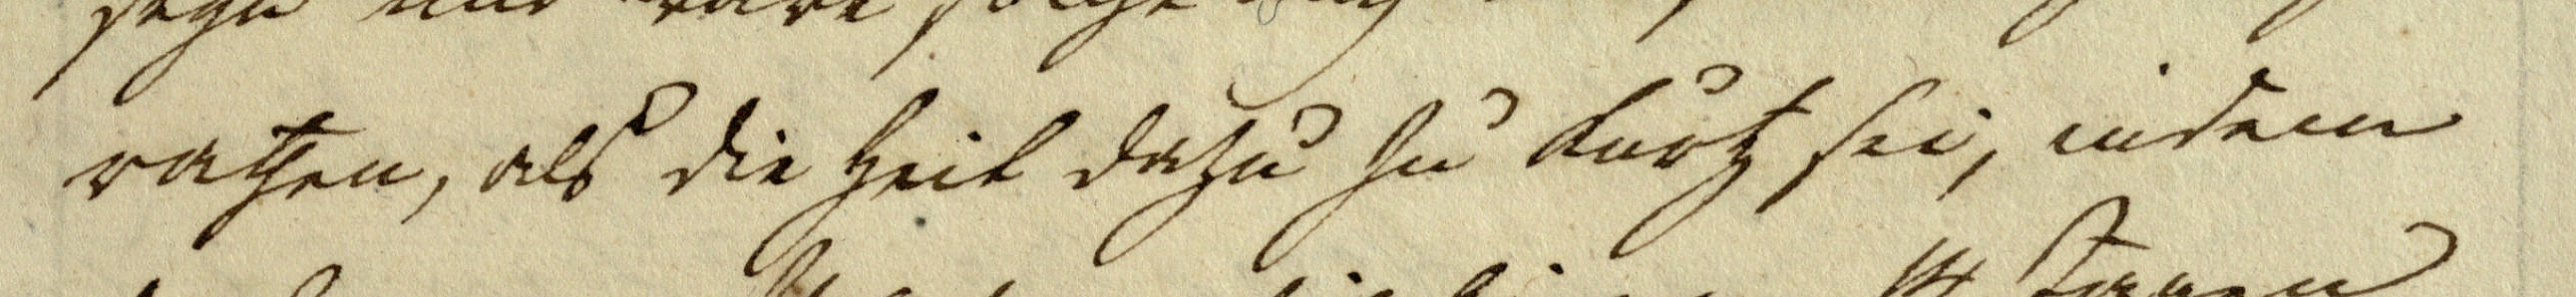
rathen, als die Zeit dazu zu kurz sei, indem
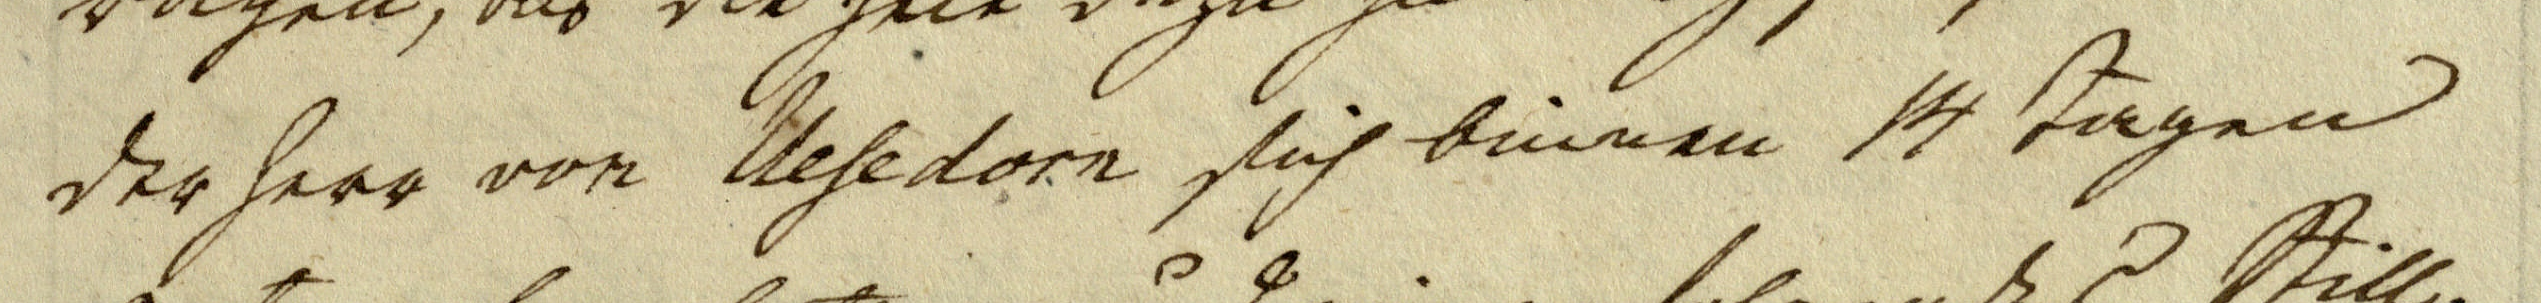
der Herr von Uesedorm sich binnen 14 Tagen
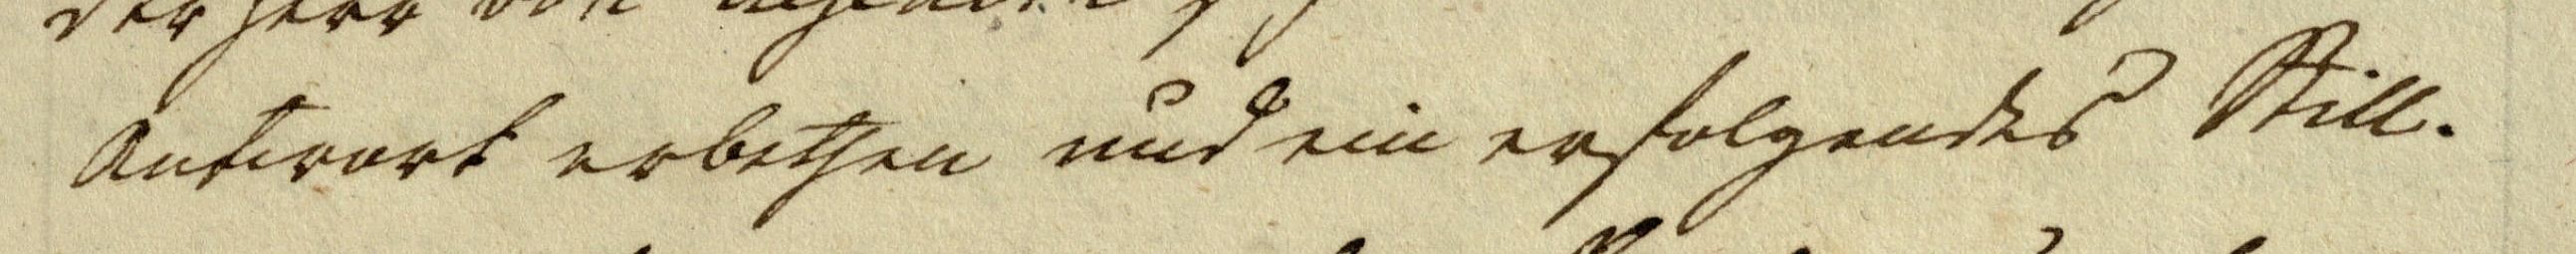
Antwort erbethen und ein erfolgendes Still¬
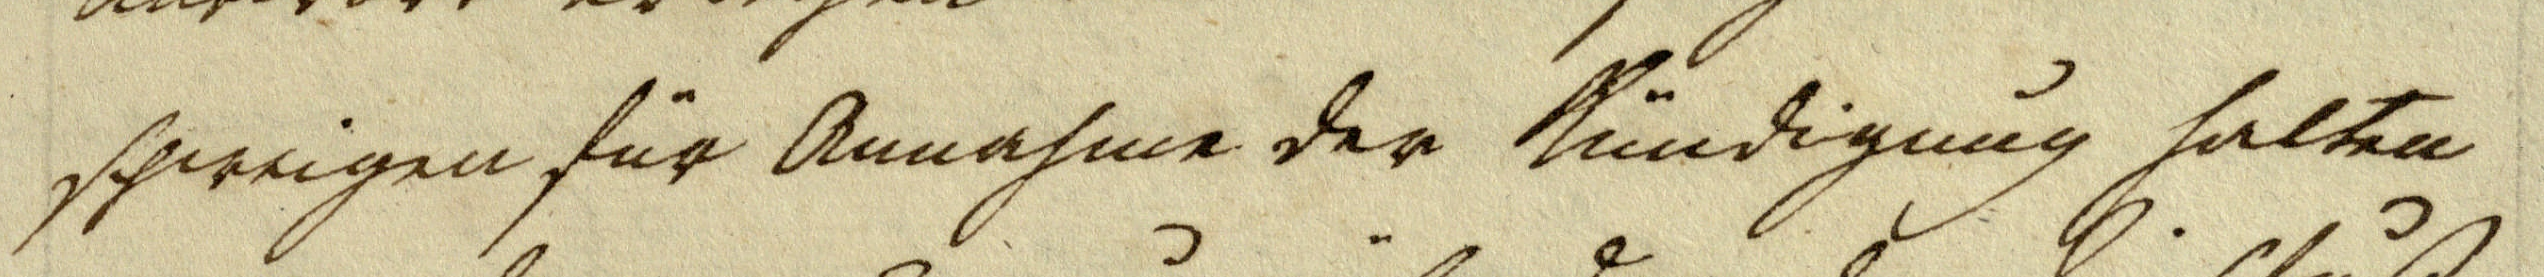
schweigen für Annahme der Kündigung halten
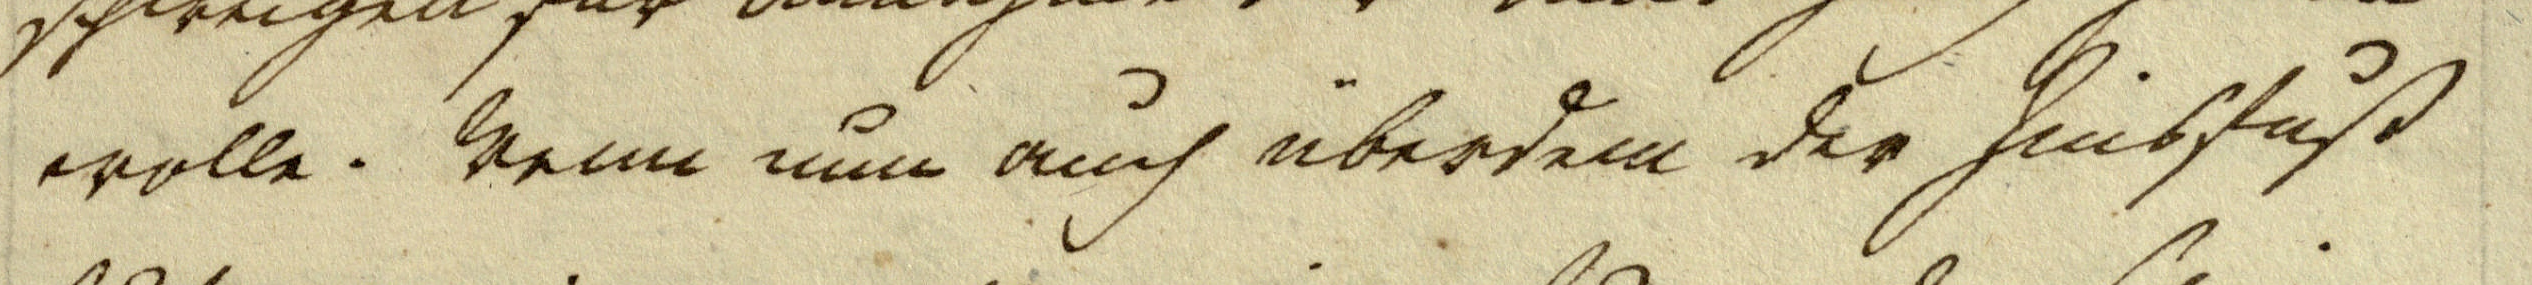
wolle. Wenn nun auch überdem der Zinsfuß
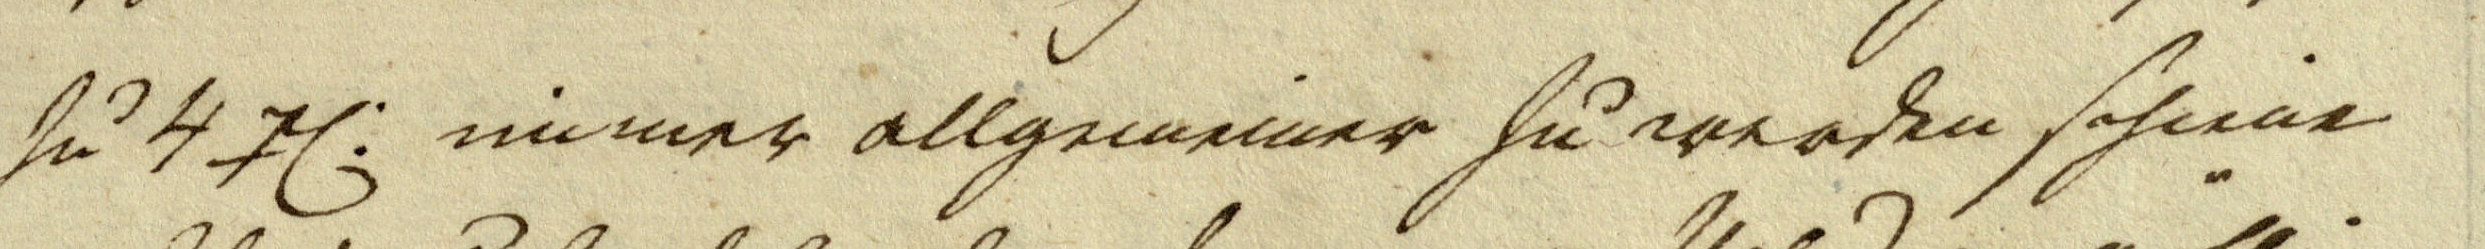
zu 4 pl. immer allgemeiner zu werden schiene
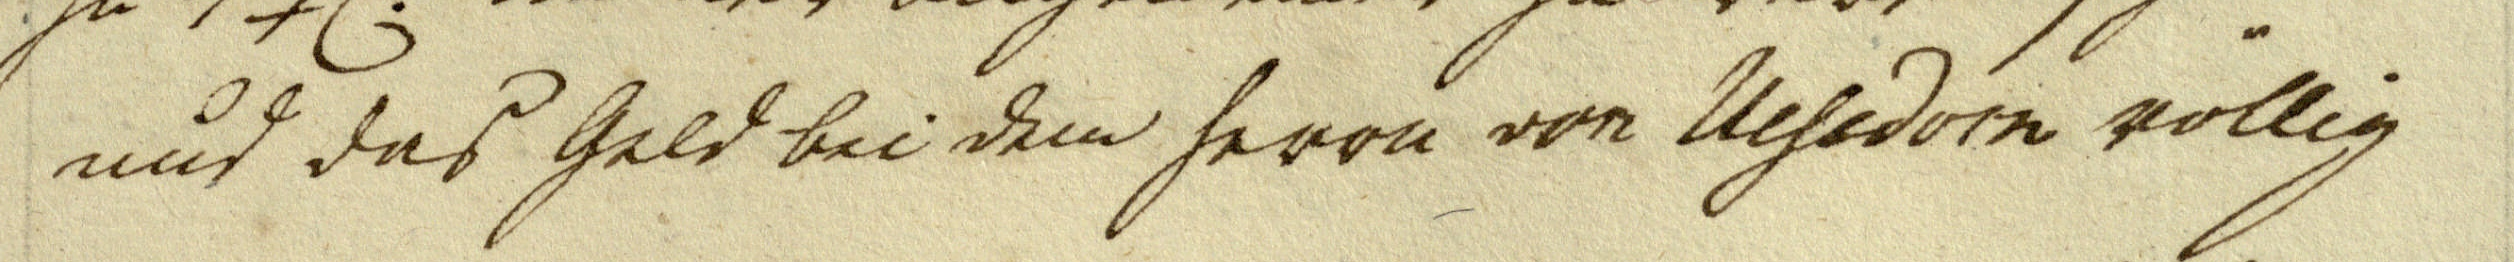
und das Geld bei dem Herrn von Uesedom völlig
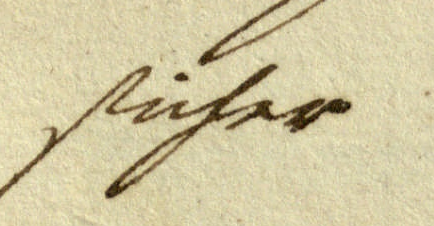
sicher
